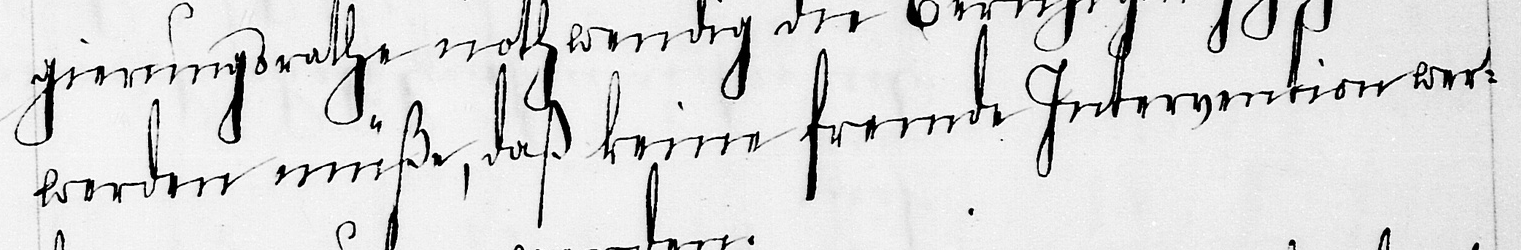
werden müße, daß keine fremde Intervention wer¬
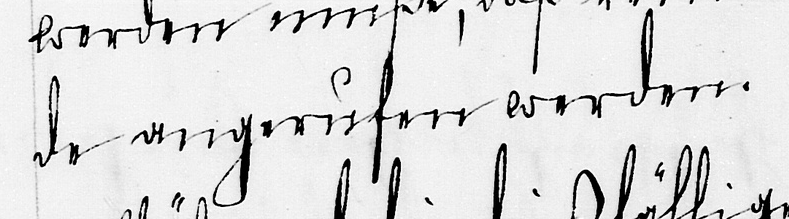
de angerufen werden.
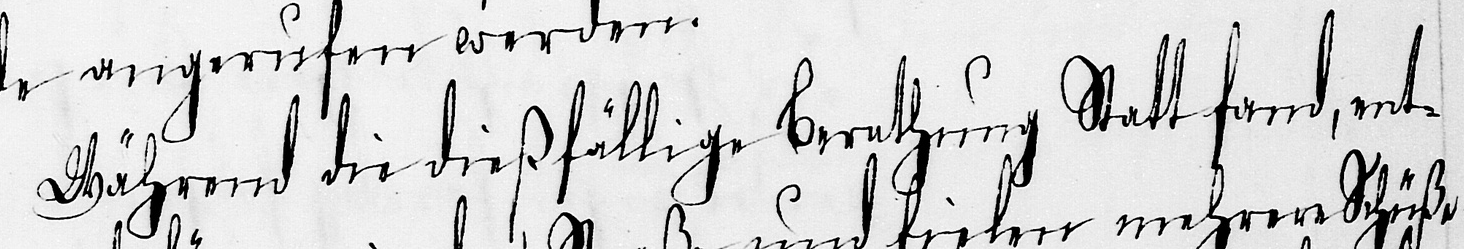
Während die dießfällige Berathung Statt fand, ent¬
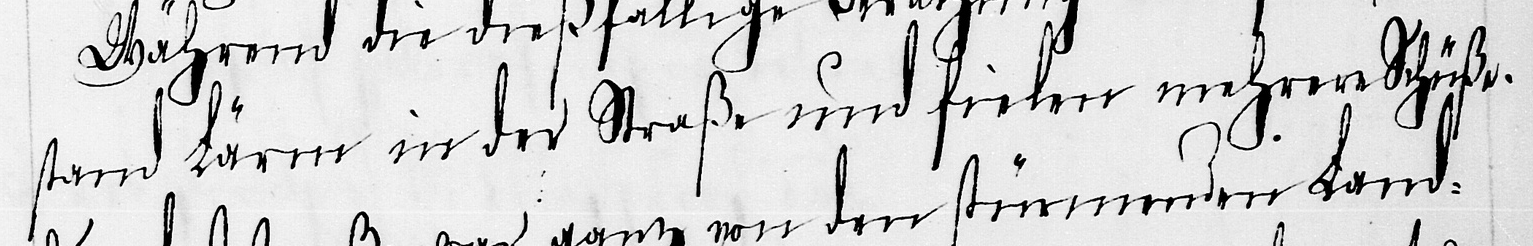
stand Lärm in der Straße und fielen mehrere Schüße.
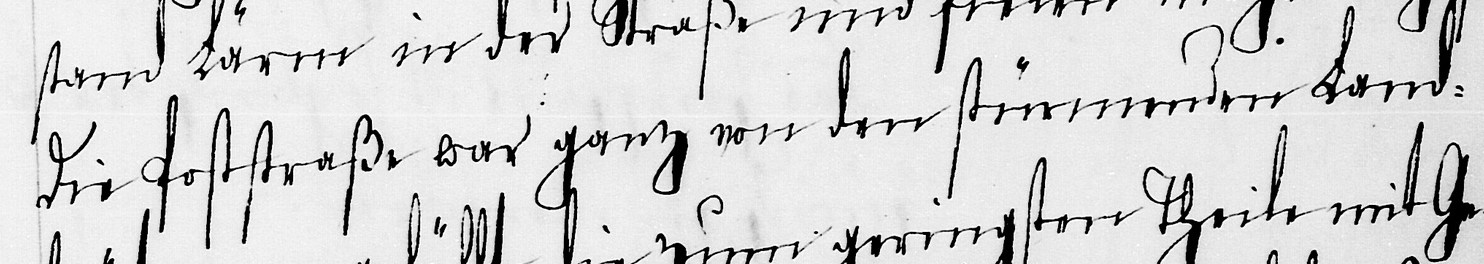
Die Poststraße war ganz von den stürmenden Land¬
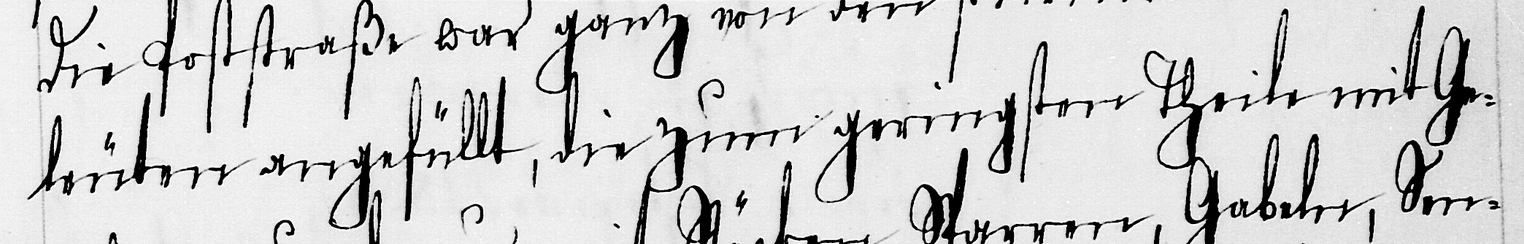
leuten angefüllt, die zum geringsten Theile mit Ge¬
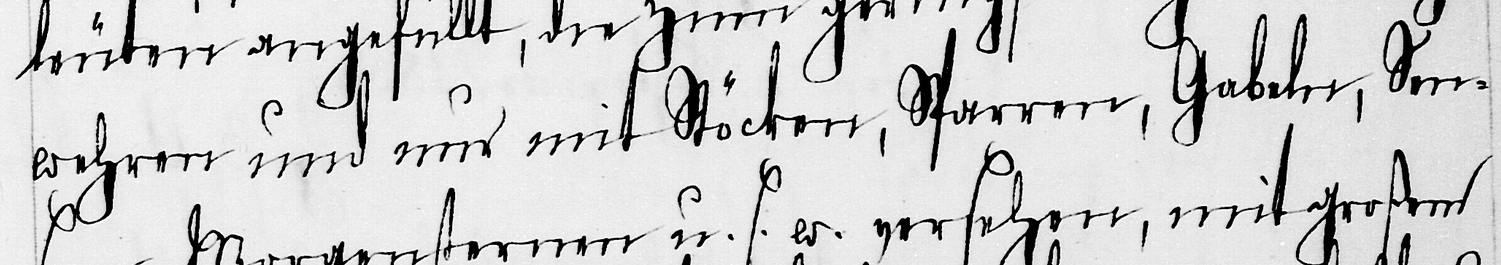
wehren und nur mit Stöcken, Sparren, Gabeln, Sen¬
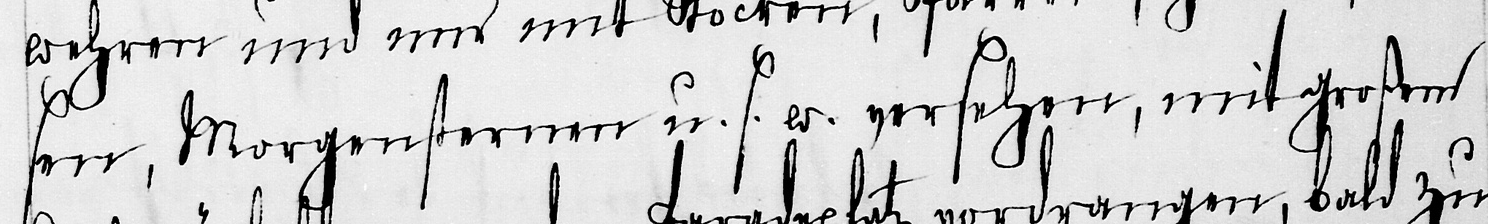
sen, Morgensternen u. s. w. versehen, mit großem
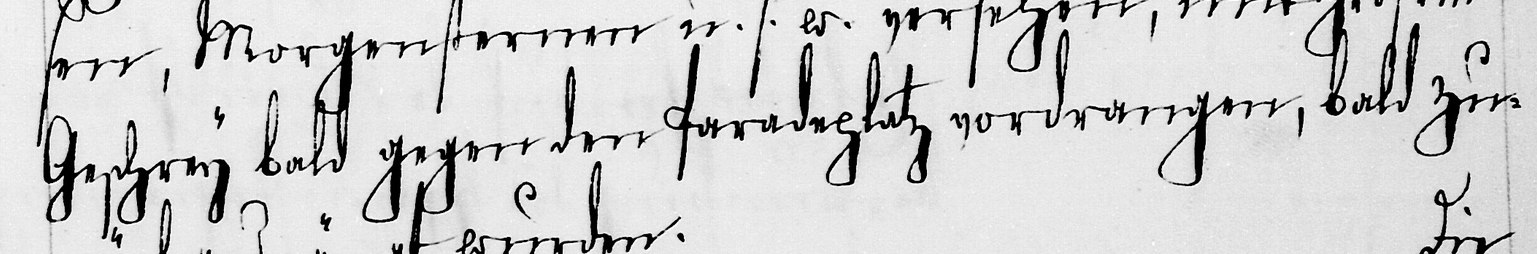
Geschrey bald gegen den Paradeplatz vordrangen, bald zu¬
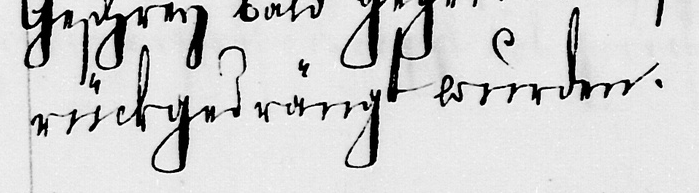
rückgedrängt wurden.
